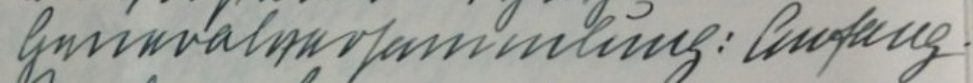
Generalversammlung: Anfang
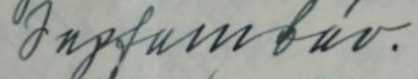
September.
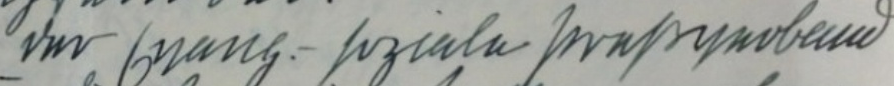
Der Evang.-sozial Preßverband
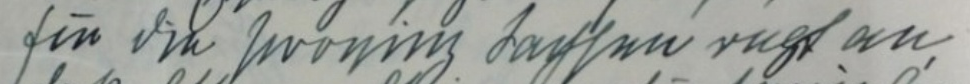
für die Provins Sachsen seagt an,
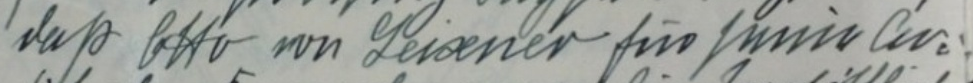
Daß Lotte von Leixner für seine Ar
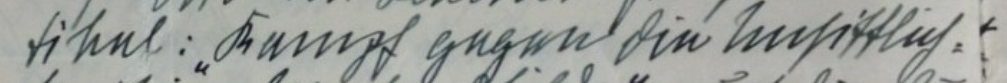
tikel: „Kampf gegen die Unsittlich
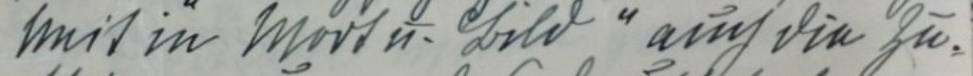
keit in Wort u. Bild" auf die Zu
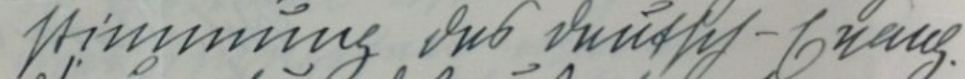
stimmung des Deutsch-Evang
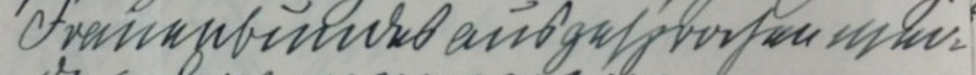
Frauenbundes ausgesrpochen wer
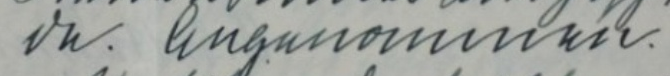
de. Angenommen
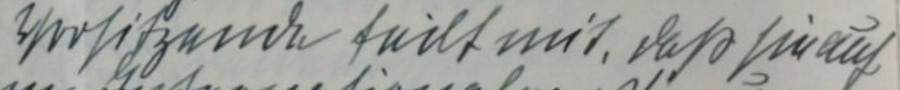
Vorsitzende teilt mit, daß sie auf
